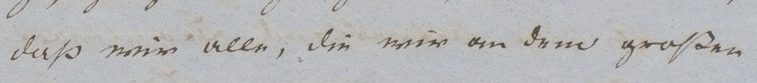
daß wir alle, die wir an dem großen
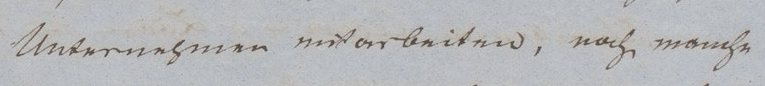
Unternehmen mitarbeiten, noch manche
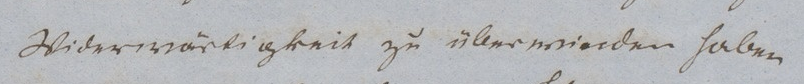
Widerwärtigkeit zu überwinden haben
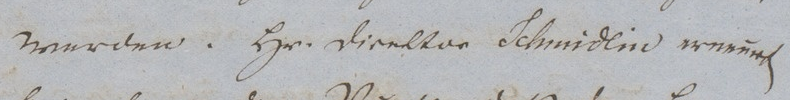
werden. Hr. Direktor Schmidlin erneuert
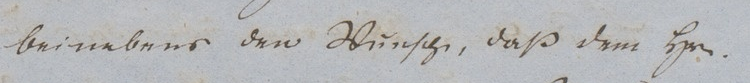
beinebens den Wunsch, daß dem Hrn.
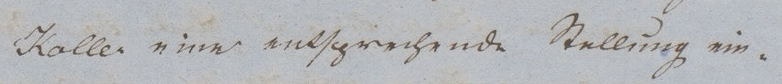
Koller eine entsprechende Stellung ein-
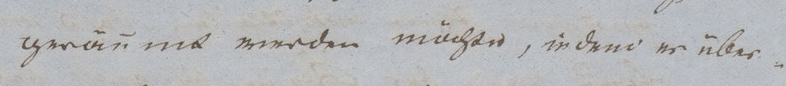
geräumt werden möchte, indem er über-
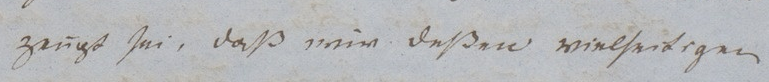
zeugt sei, daß wir deßen vielseitigen
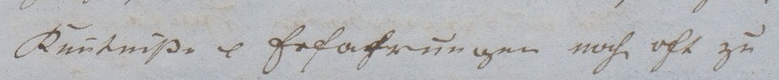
Kenntniße & Erfahrungen noch oft zu
